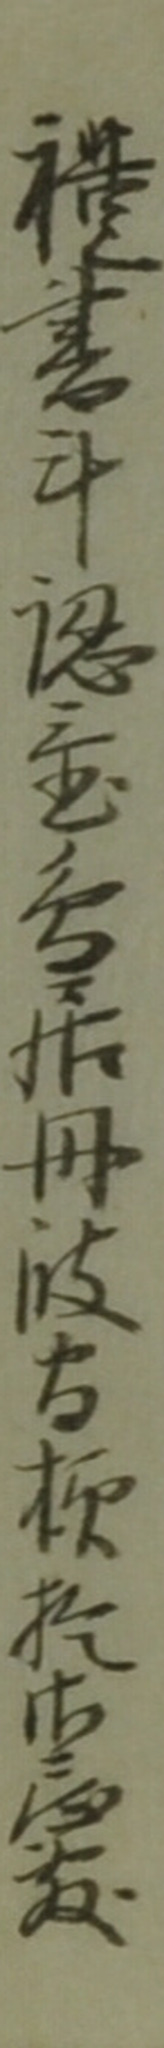礼書斗認置鳥居丹波守様於御屋敷
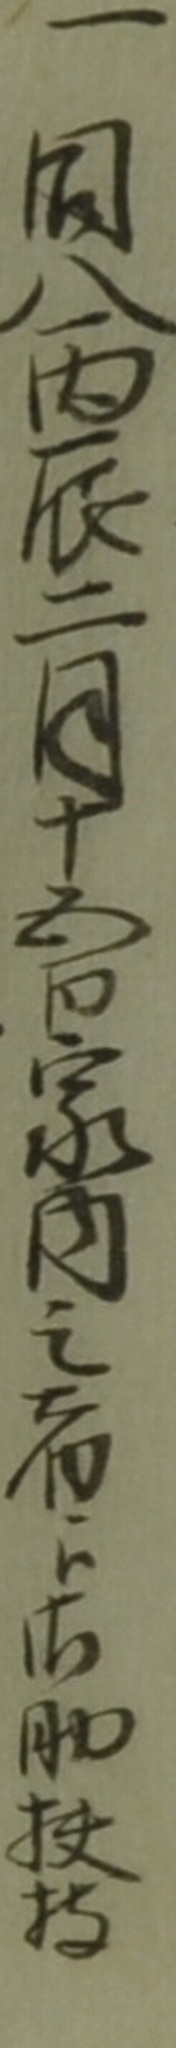一同八丙辰二月十五日家内之者被御助扶持
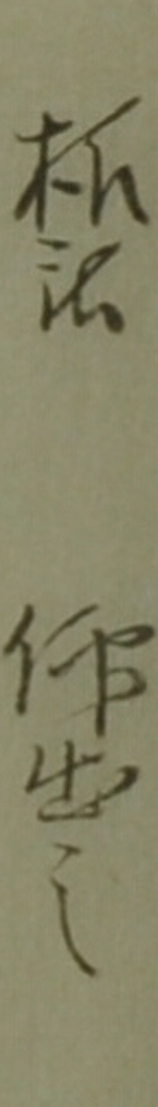様被仰出之
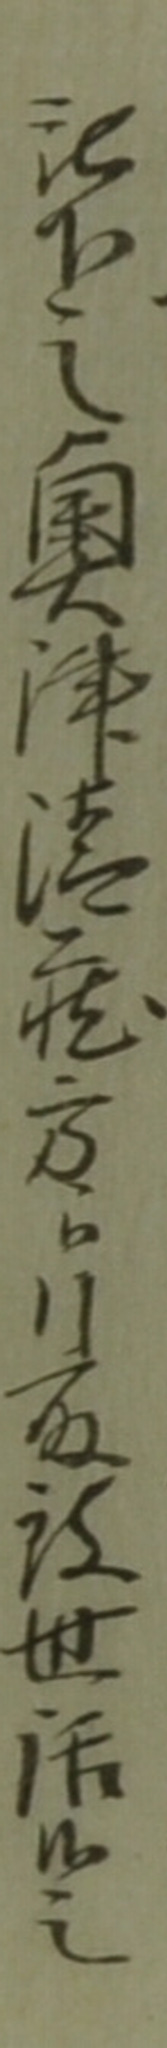被下之奥津清蔵方江引取致世話御之

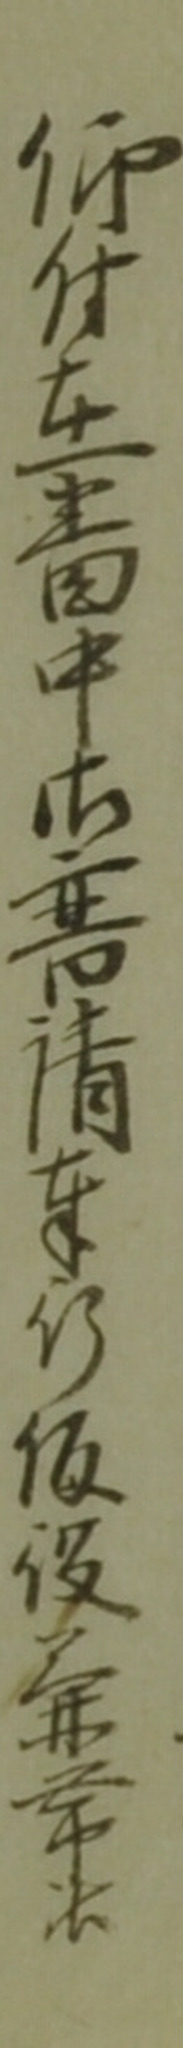仰付在番中御普請奉行仮役兼帯被
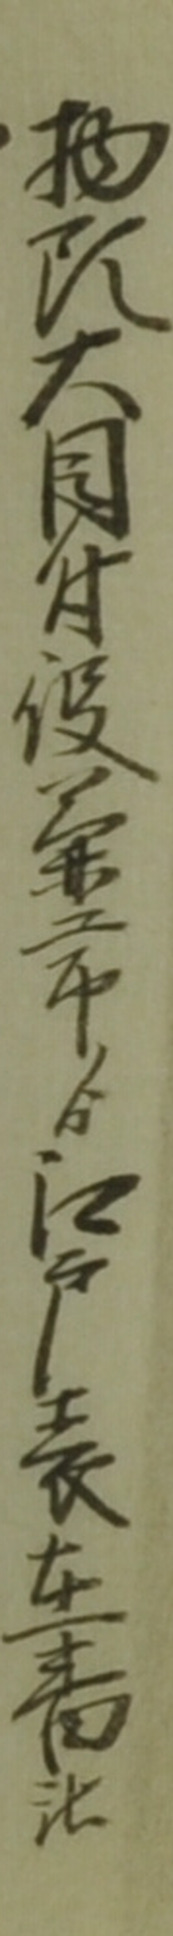物頭大目付役兼帯ゟ江戸表在番被
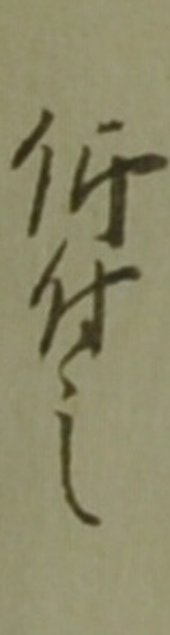仰付之
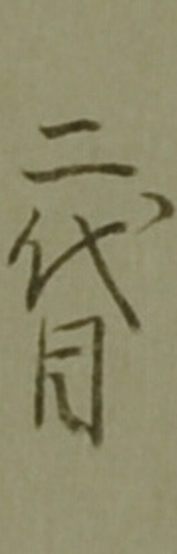二代目
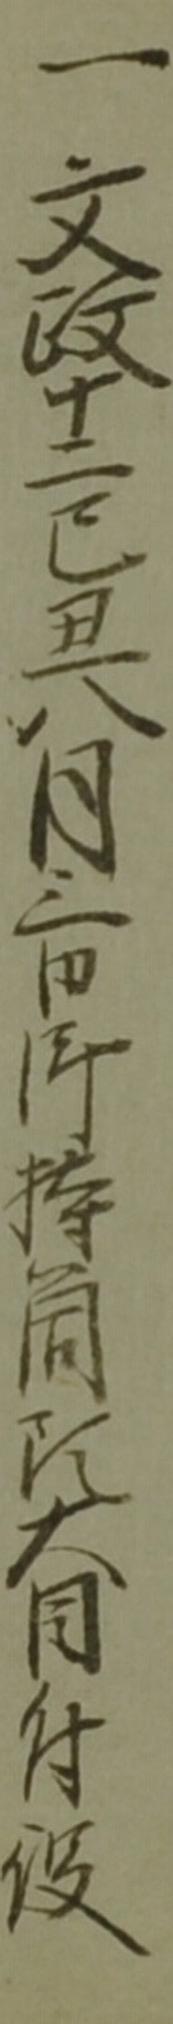一文政十二己丑八月三日御持筒頭大目付役
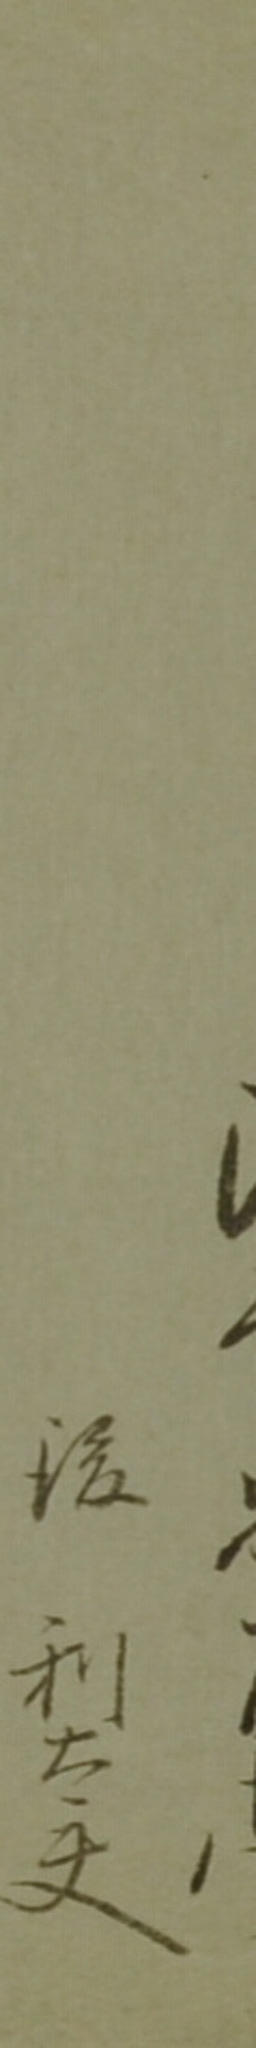後利太夫
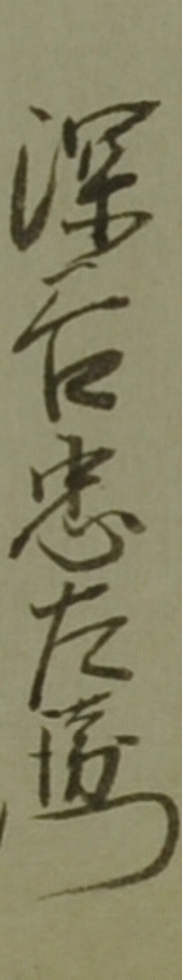深谷忠左衛門
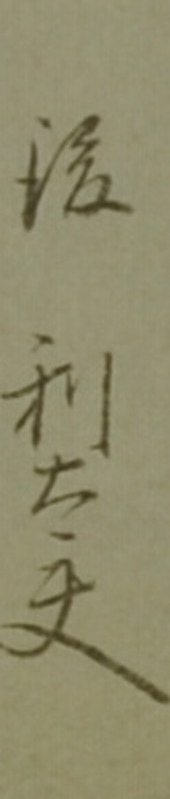後利太夫
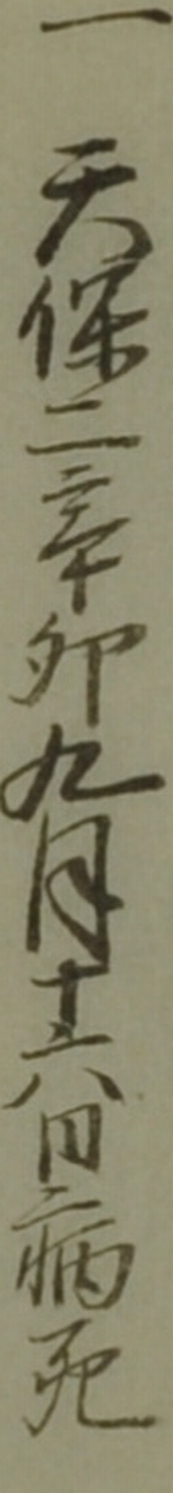一天保二辛卯九月十六日病死
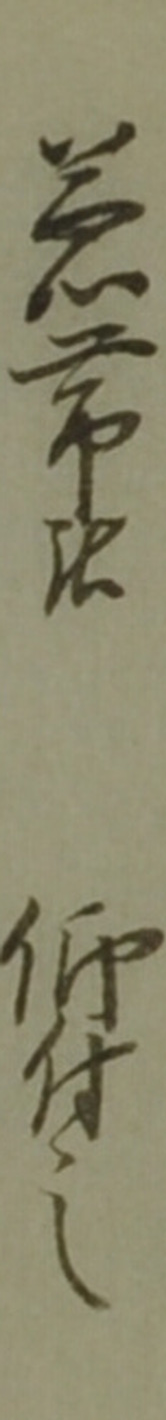兼帯被仰付之
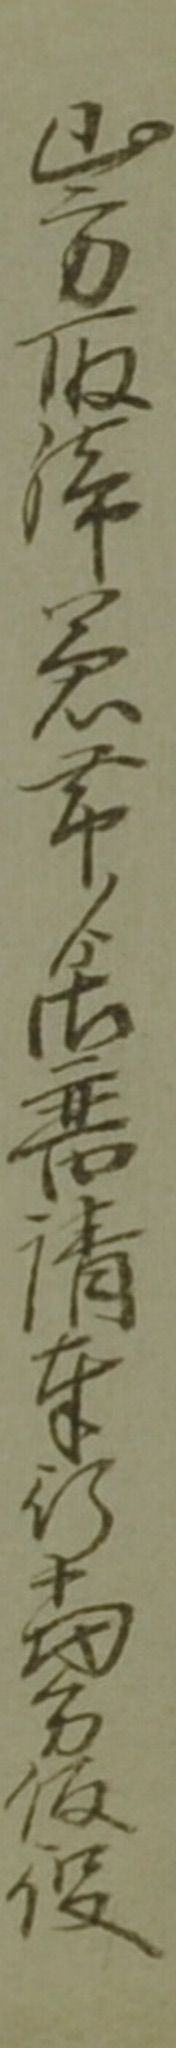山方取締兼帯ゟ御普請奉行当分仮役
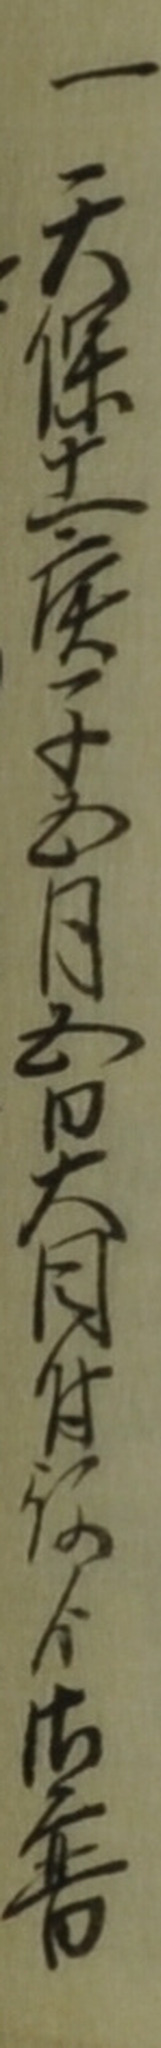一天保十一庚子五月五日大目付役ゟ御普
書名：諸御役代々録（六）
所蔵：伊那市立高遠町図書館・合同会社AMANE
